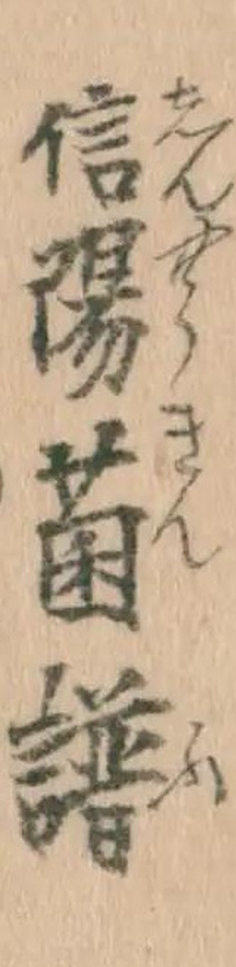信陽菌譜
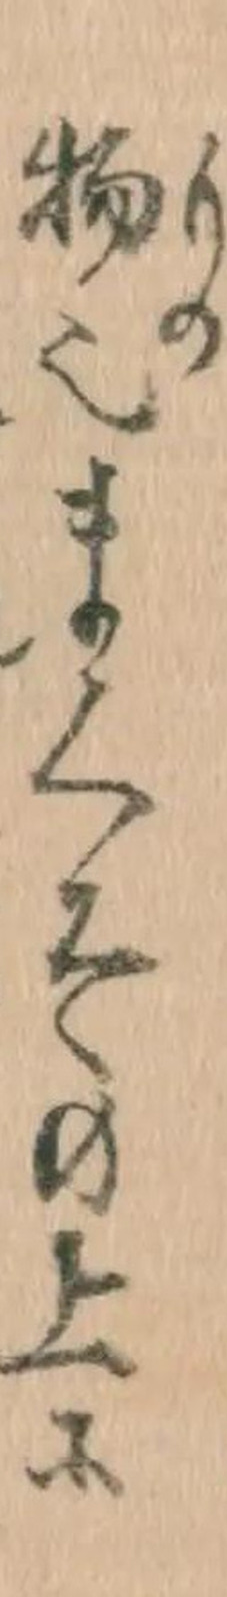物也まくその上に
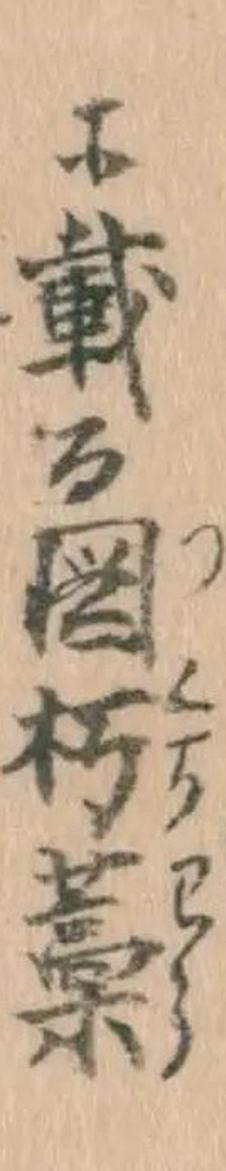に載る図朽藁
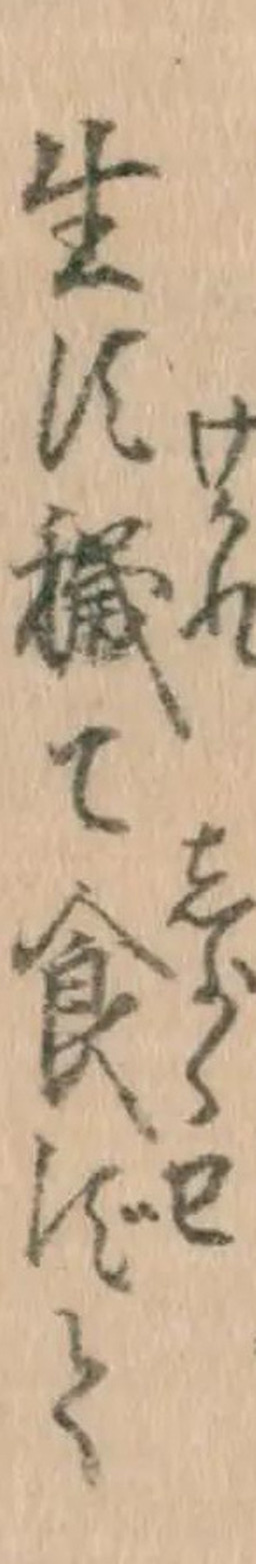生す穢て食ずと
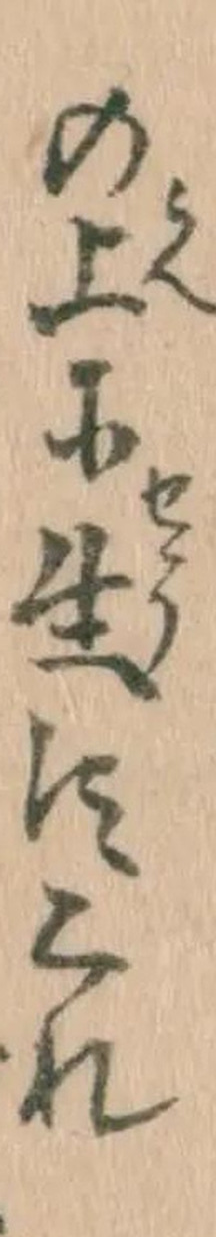の上に生すこれ
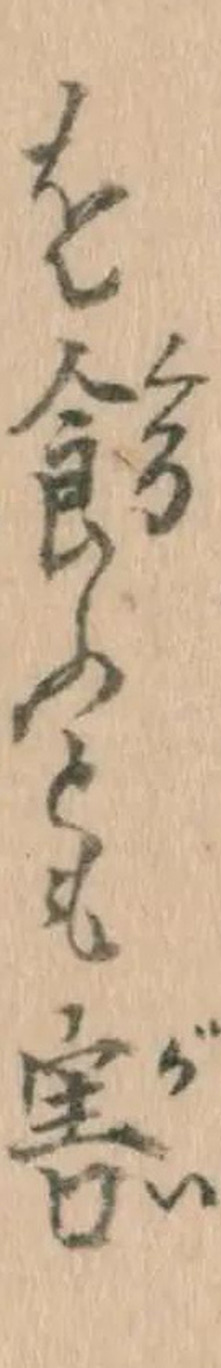を食ふとも害
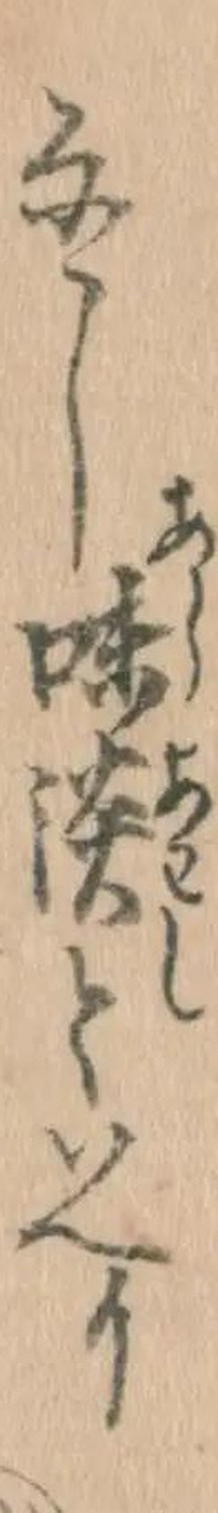なし味淡といへり

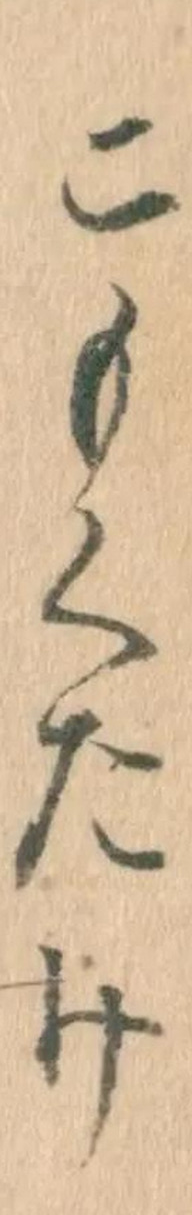こもくたけ
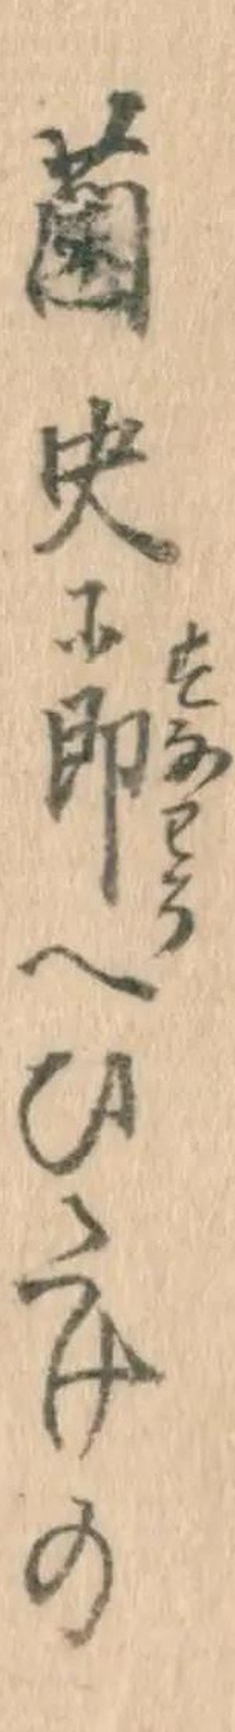菌史に即へひたけの
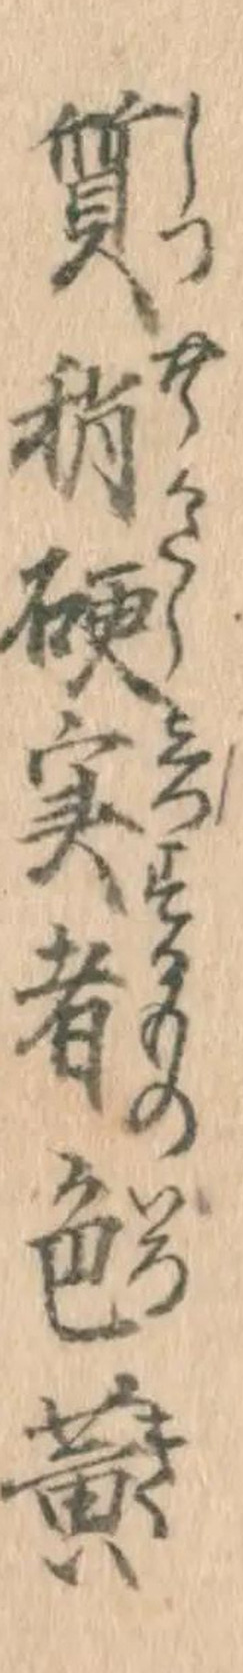質稍硬実者色黄
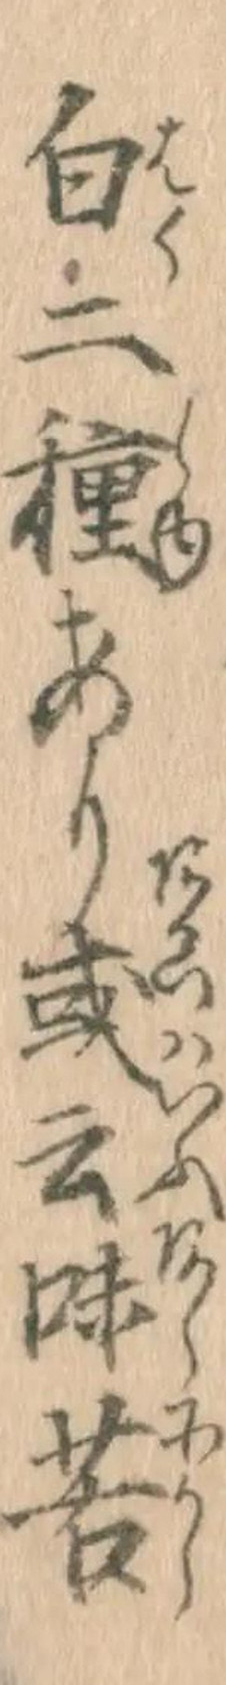白二種あり或云味苦
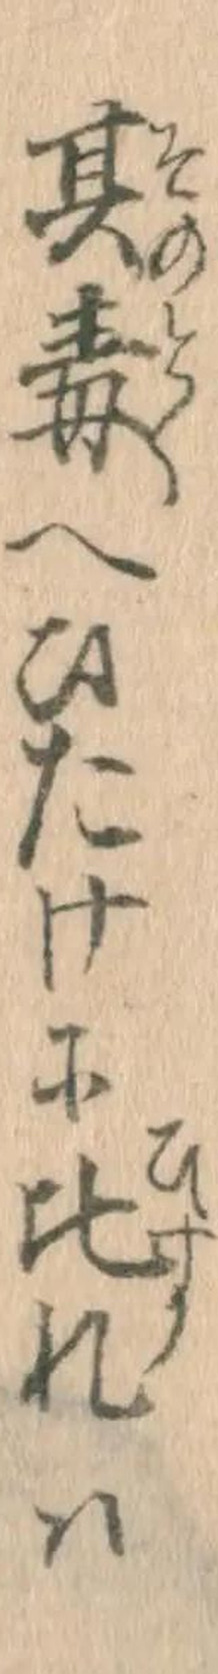其毒へひたけに比れは
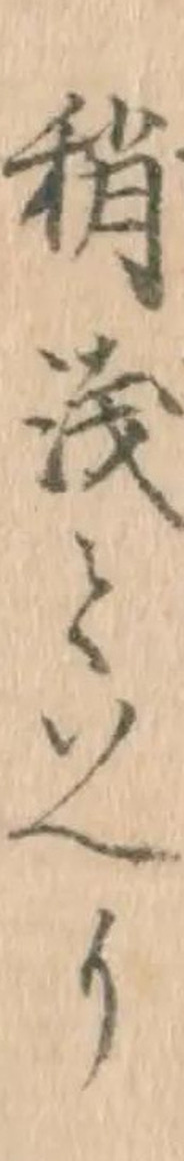稍浅といへり
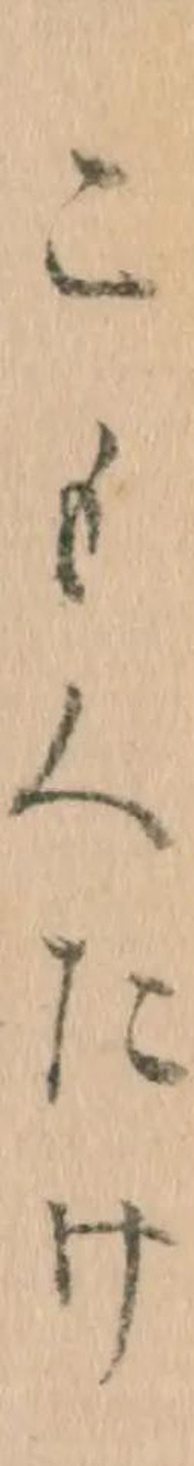こもくたけ

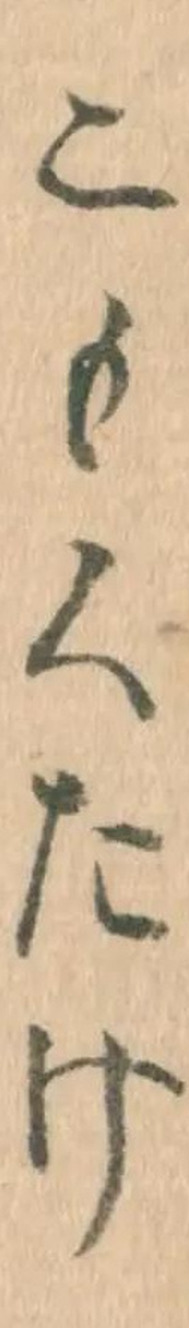こもくたけ
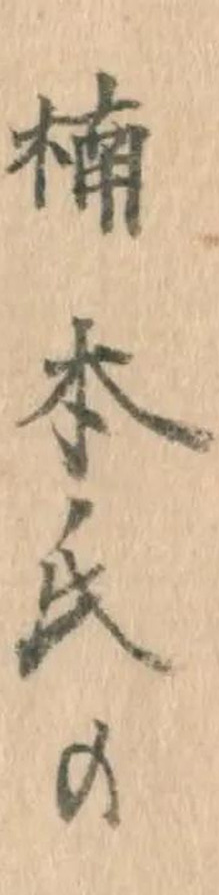楠本氏の
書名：本草図譜. 巻58-60
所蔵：国立国会図書館 National Diet Library, JAPAN
